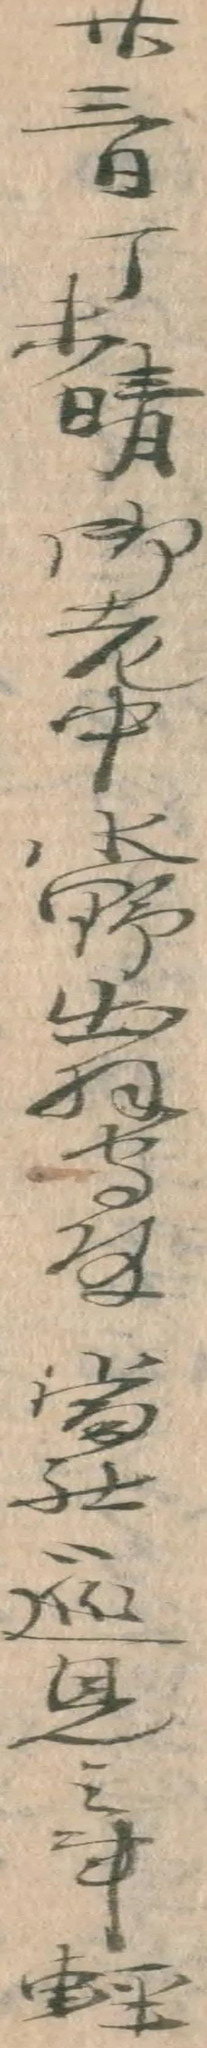廿三日丁未晴御老中水野出羽守殿當社御巡見之事軽
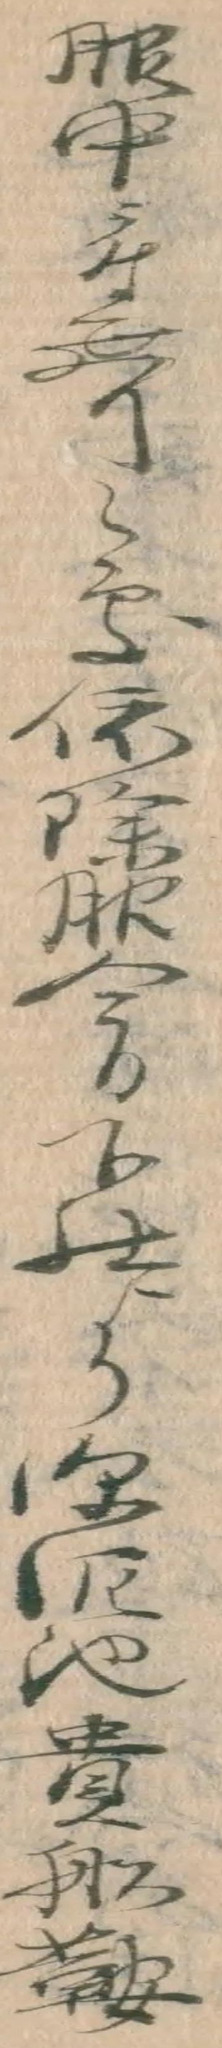服中に付無引候處依除服今日下社より深泥池貴舩鞍
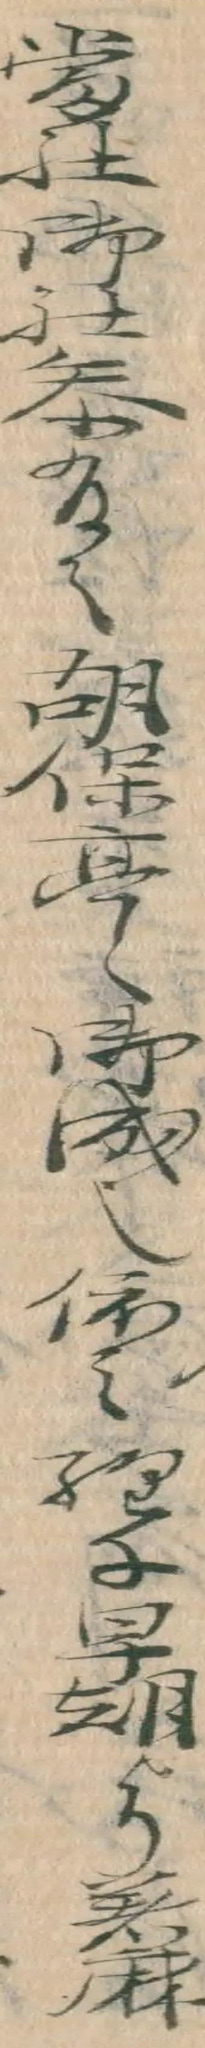當社御社参有之胡保亭へ御成也依之経千早朝より着麻
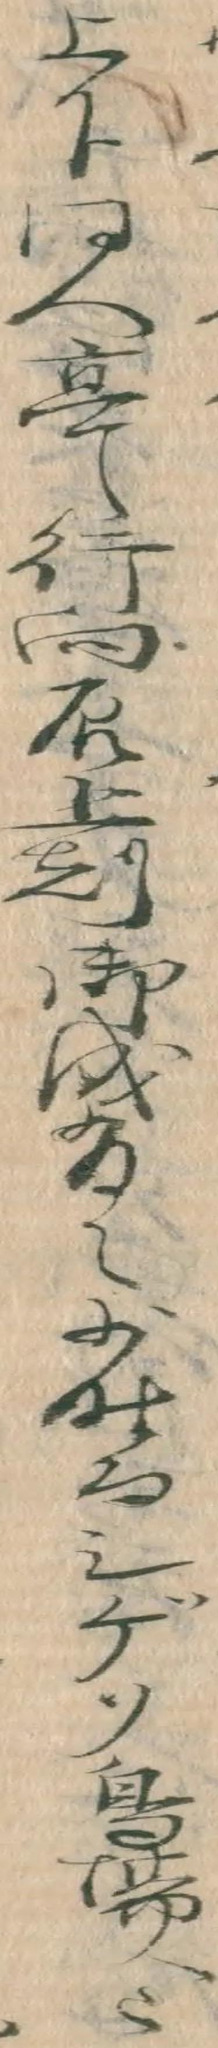上下同人亭行向辰上刻御成有之少時而シゲリ鳥場へ被
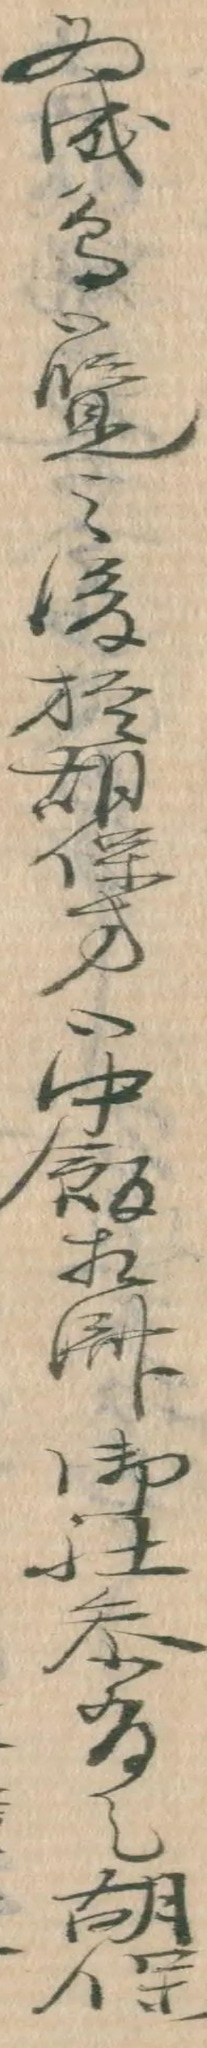為成鳥御覧之後於胡保方御中飯相済御社参有之胡保
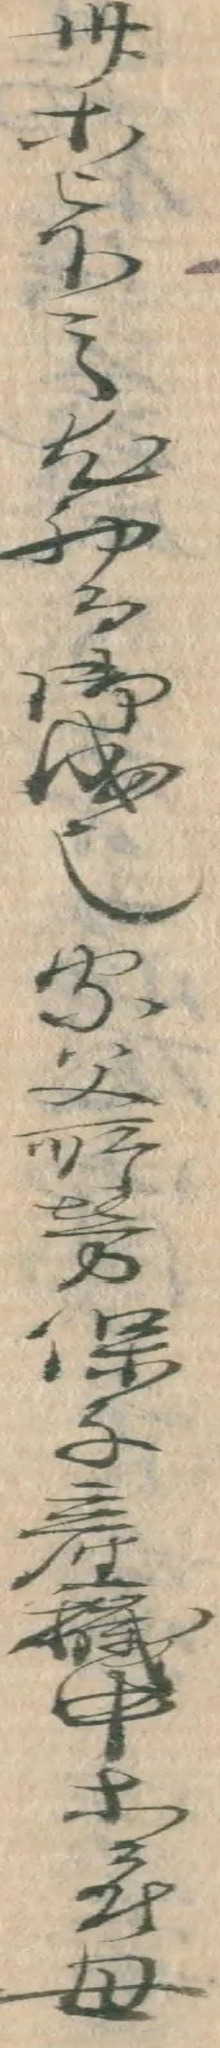卅等被下之尤初而御成也家父所労保子産穢中等ニ付母
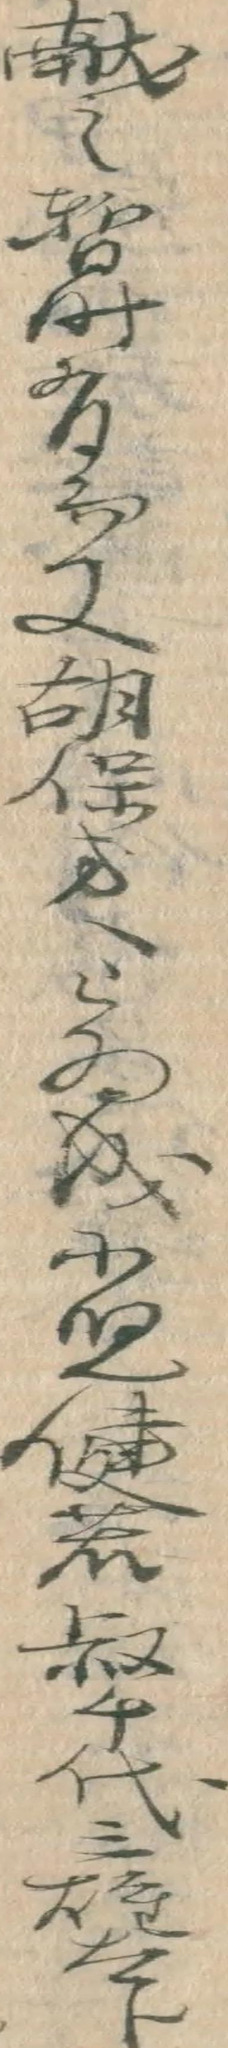献之暫時有而又胡保方へ被為成小児健若叔十代三雄太郎
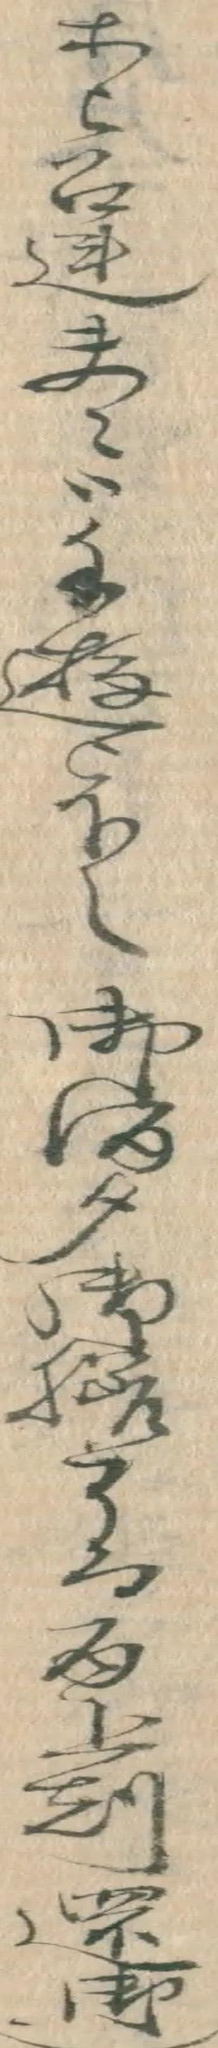等被召連夫々御手遊被下也御酒夕御膳方ニ而酉上刻還御也
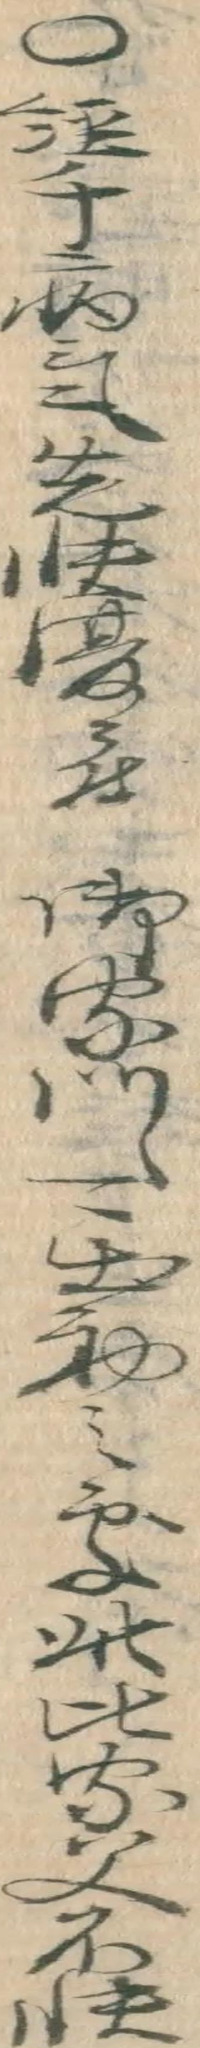○経千病気先快復ニ付御家門可出勤之處此比家父不快
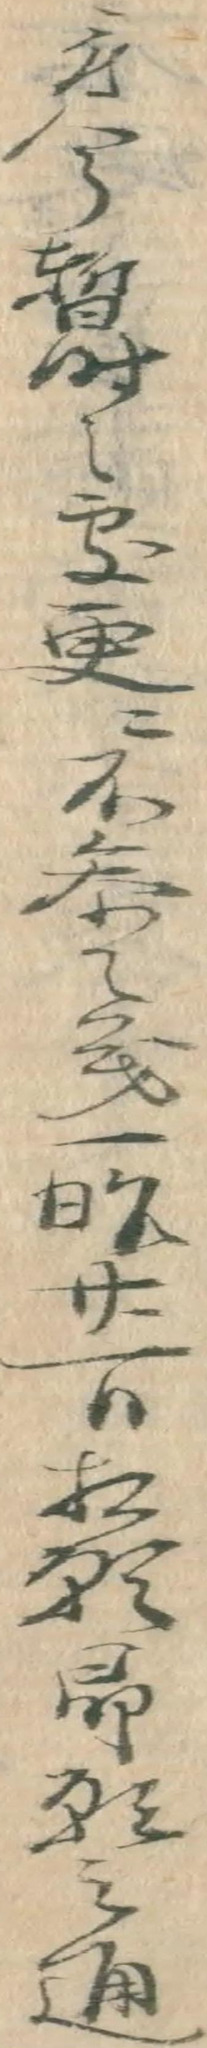ニ付今暫時之處更ニ不参之義一昨廿一日相願即願之通
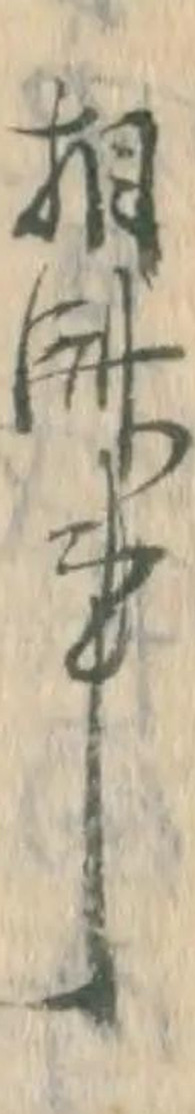相済事

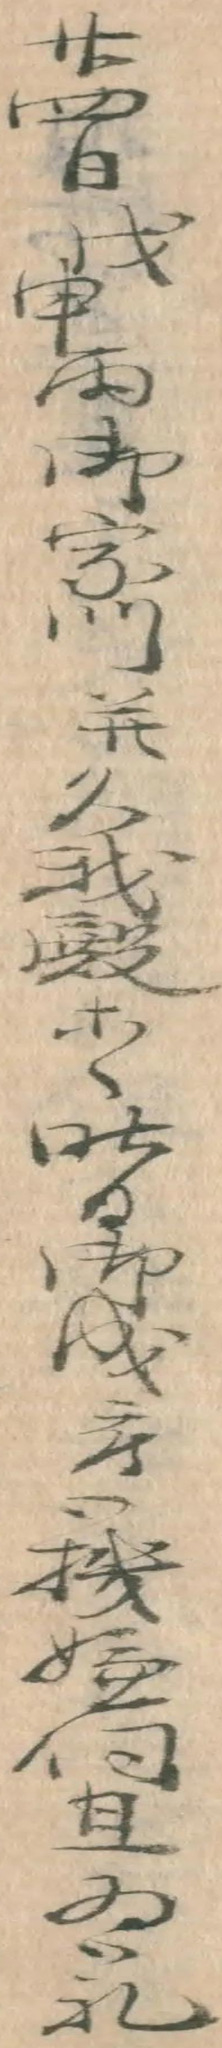廿四日戊申雨御家門并久我殿等へ昨日御成ニ付御機嫌伺且為御礼
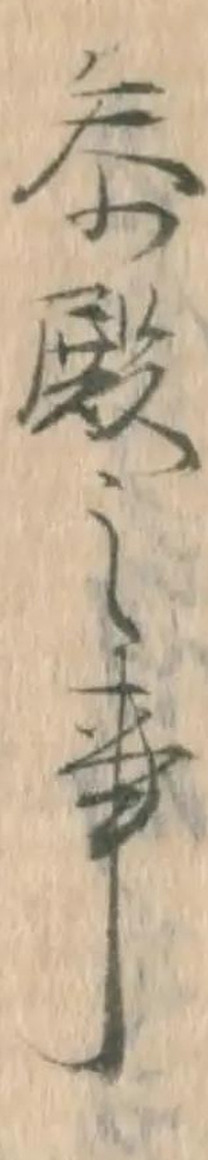参殿之事
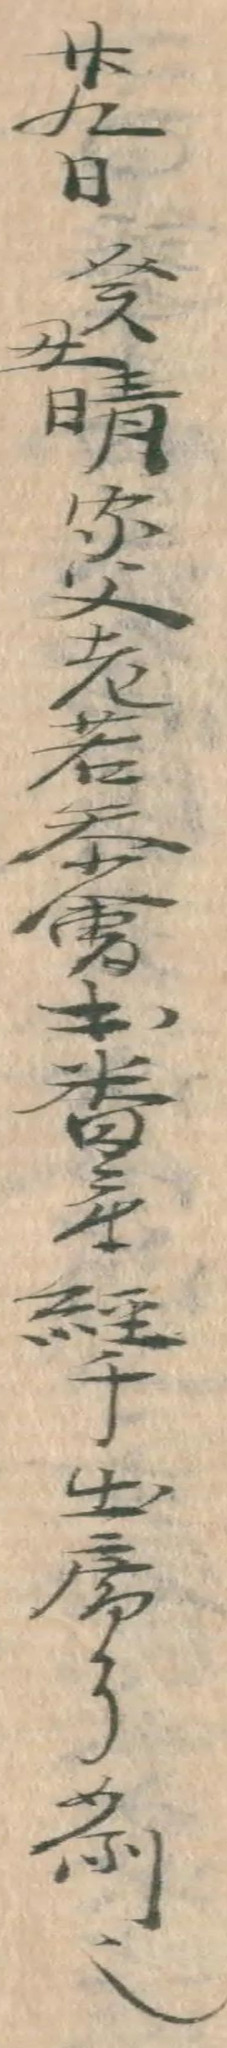廿九日癸丑晴家父老若参會出番ニ付経千出席了如例也
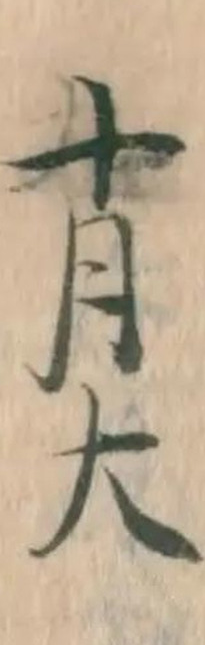十月大
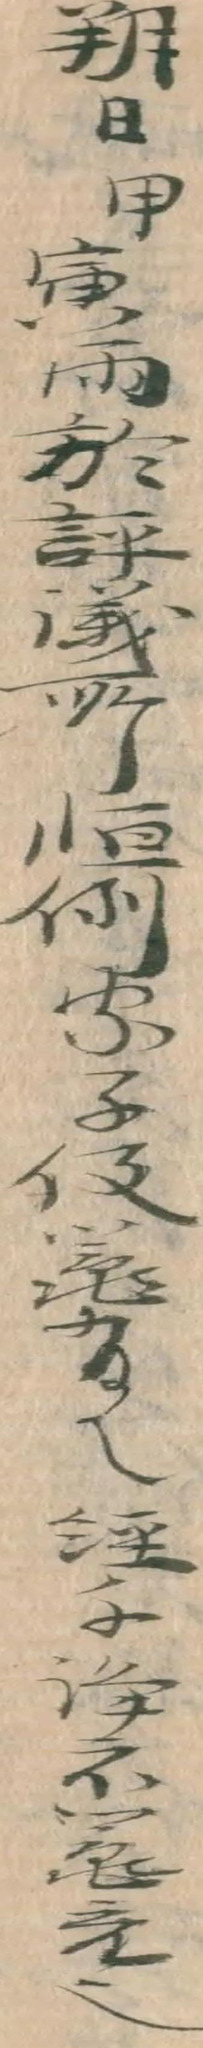朔日甲寅雨於評議所恒例家子役鬮有之経千許不鬮充也
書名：賀茂社記録. 第65冊
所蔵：国立国会図書館 National Diet Library, JAPAN
